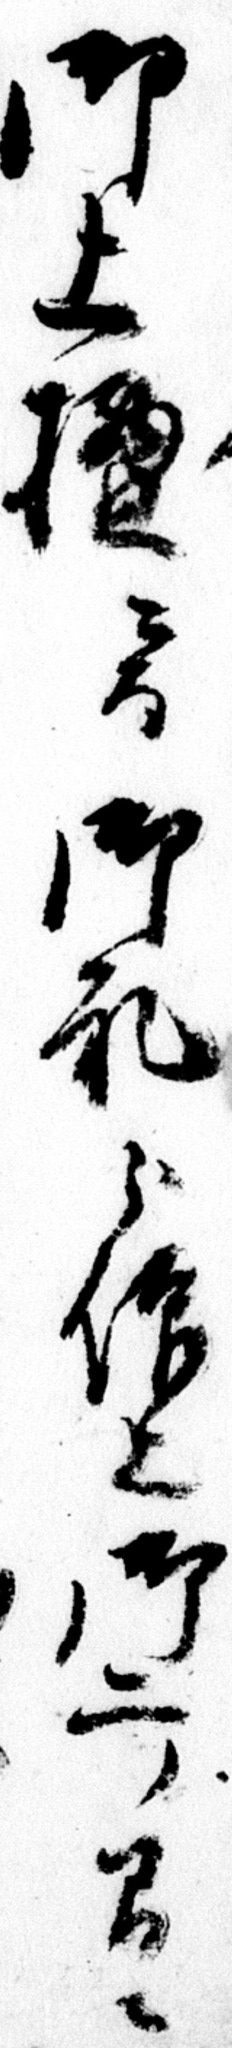御上壇ニ而御礼被仰上御二ノ間ニ
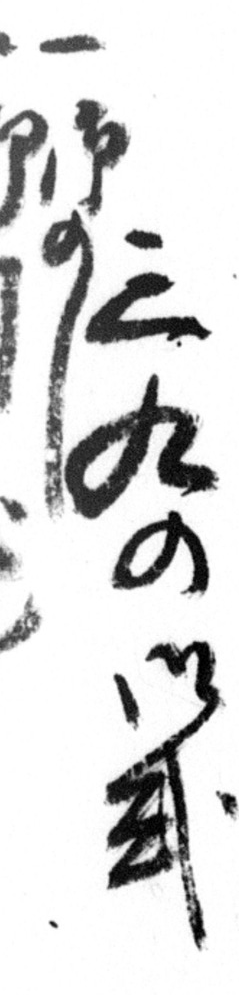三九の御式
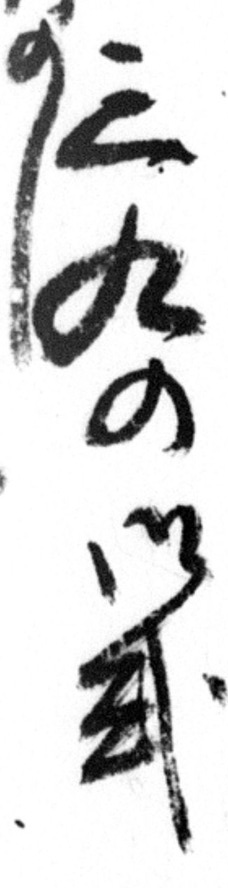三九の御式
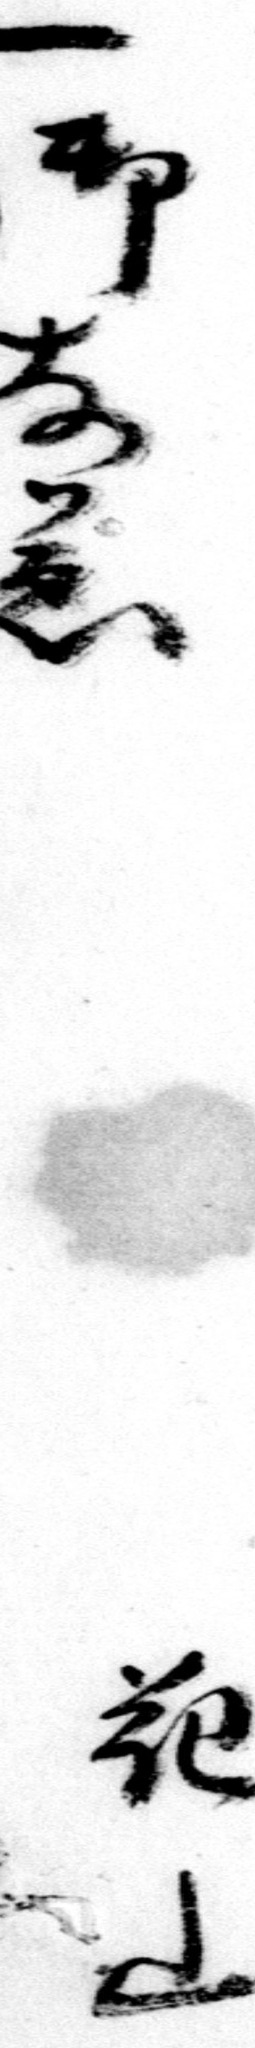一御なかゑ花山

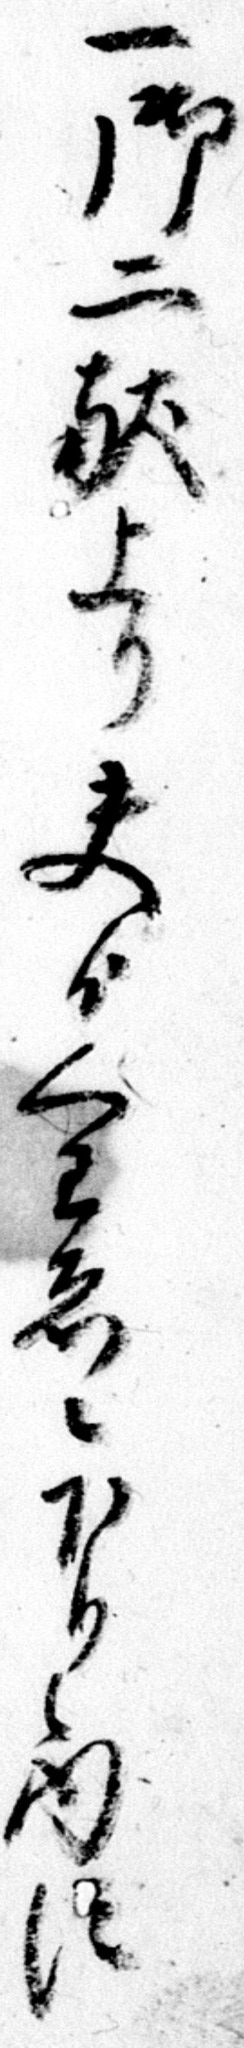一御二献上り夫ゟくわゑ被下り候内に
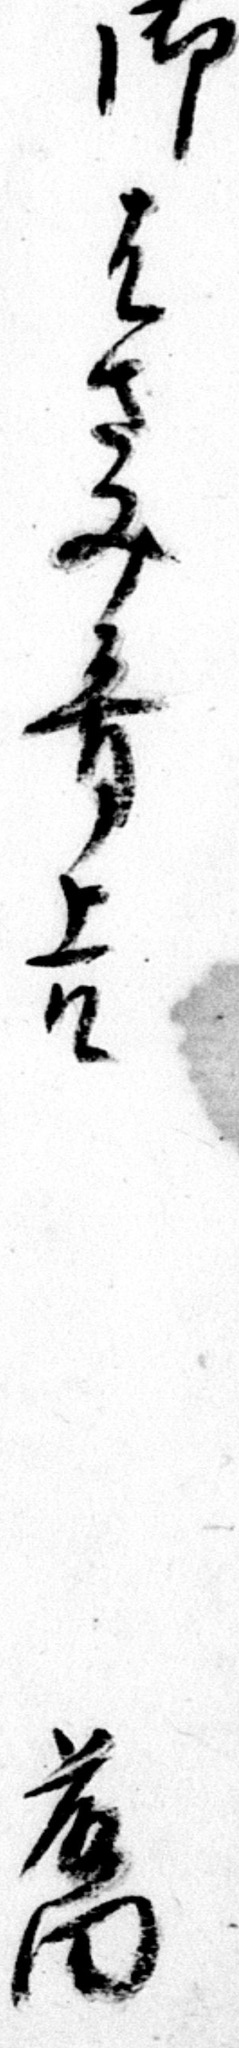御はさみ肴上ル藤田
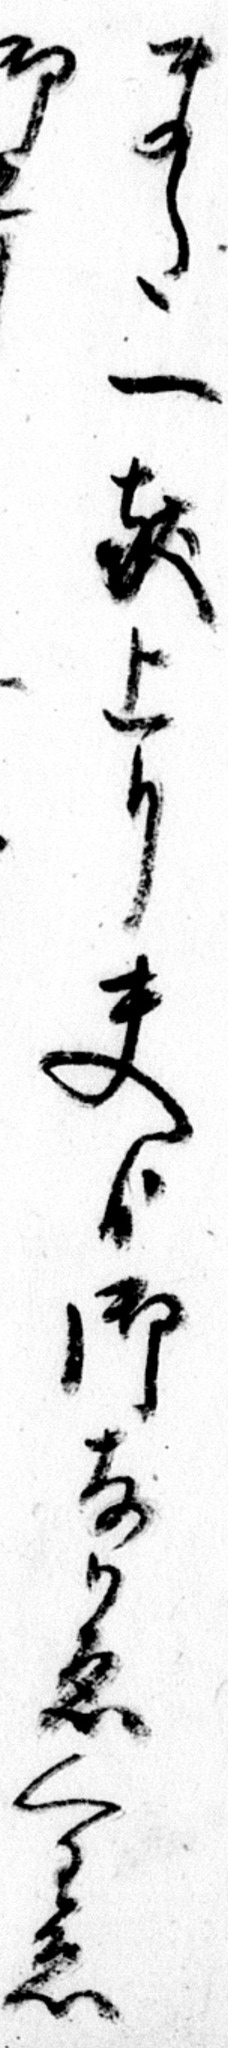また一献上り夫ゟ御なかゑくわゑ
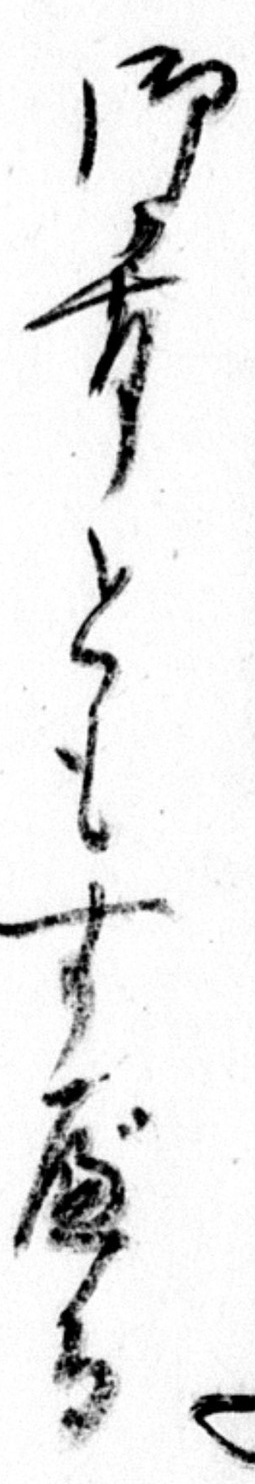御肴ともすべる
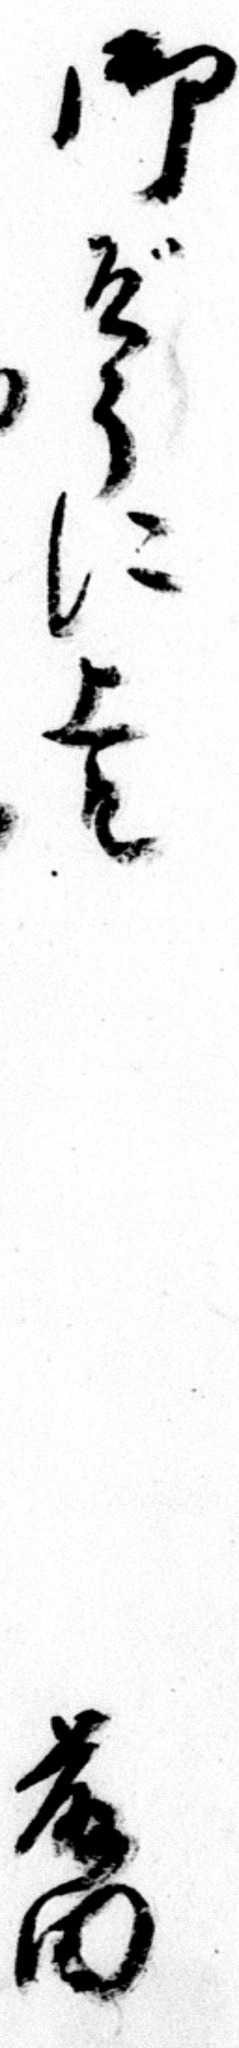一御ぞうに上ル藤田
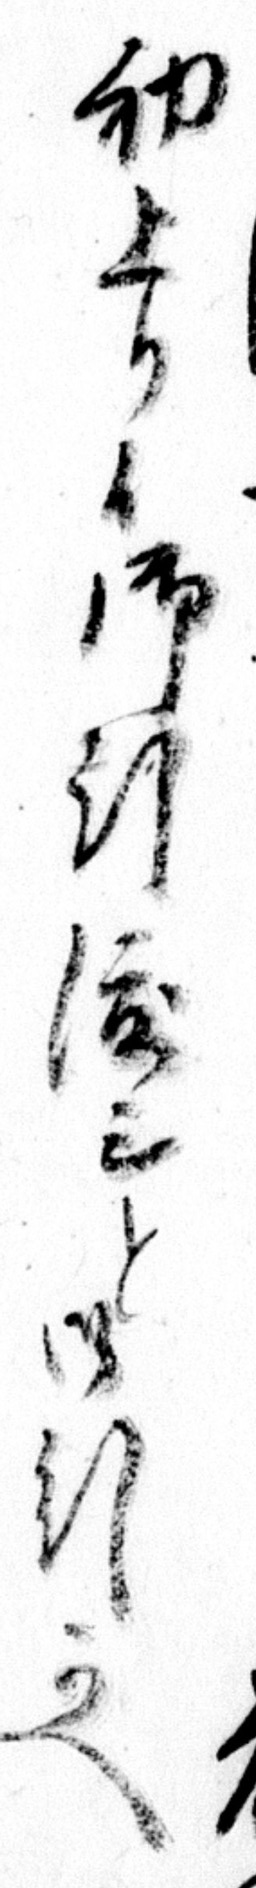初上り候御引渡シと御引かへ
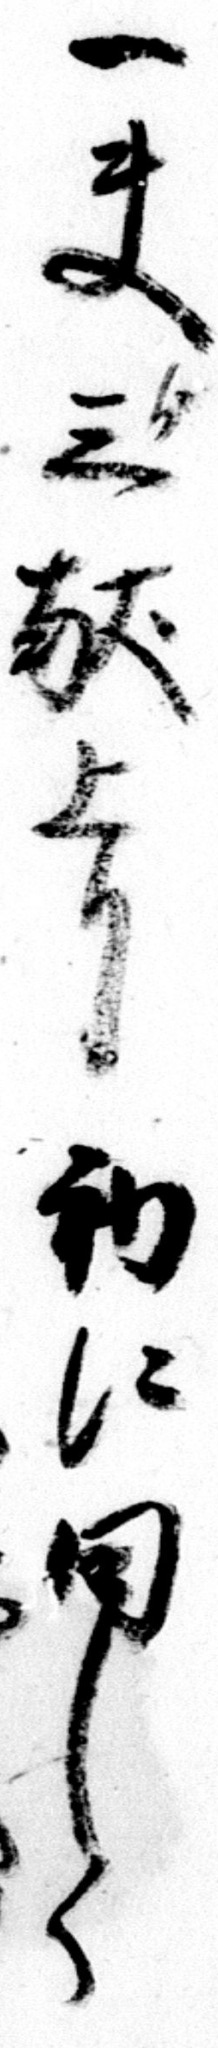一夫ゟ三献上り初に同しく
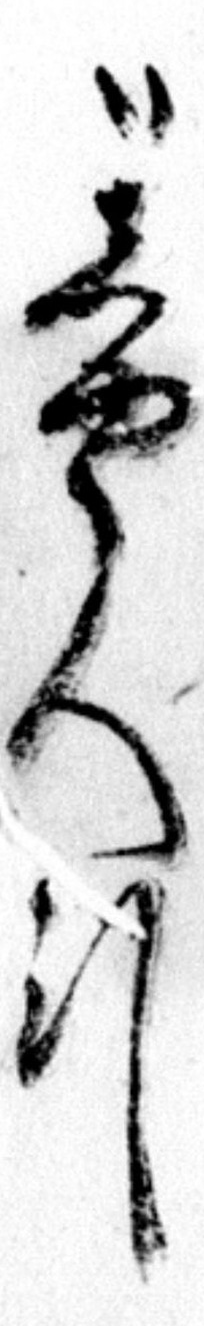御しやく引
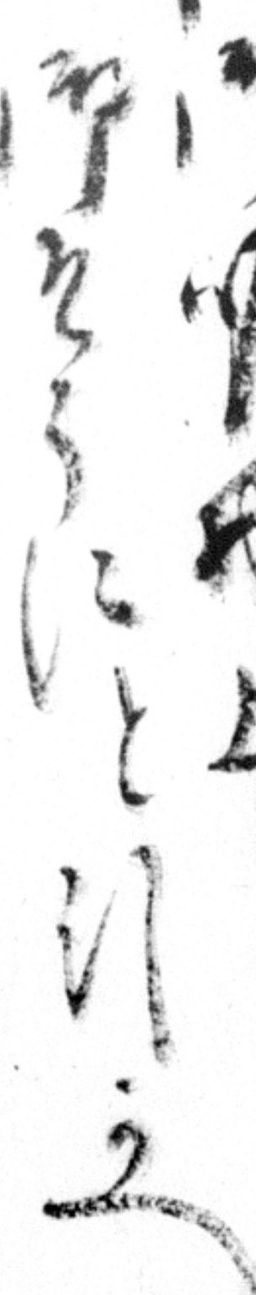御そうにと引かへ
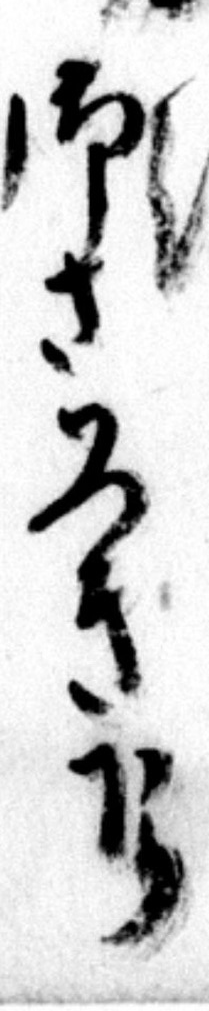御さかつきなり
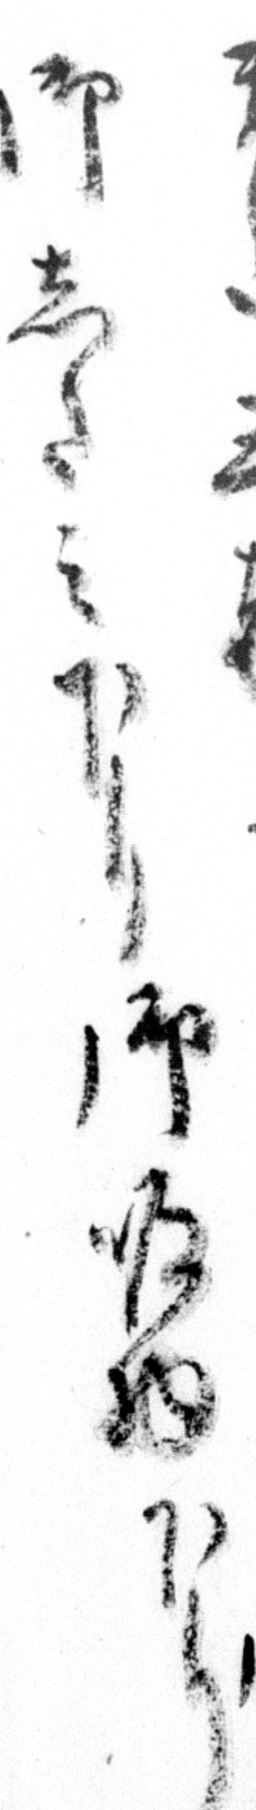御したみ下り御吸物下り
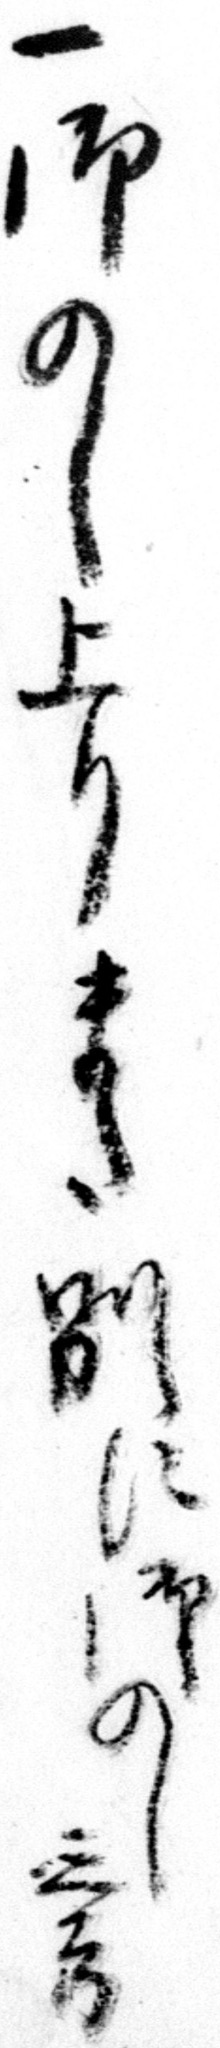一御のし上りまた別に御のし三方
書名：光姫様御かねはじめ御式
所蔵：徳島県立図書館
